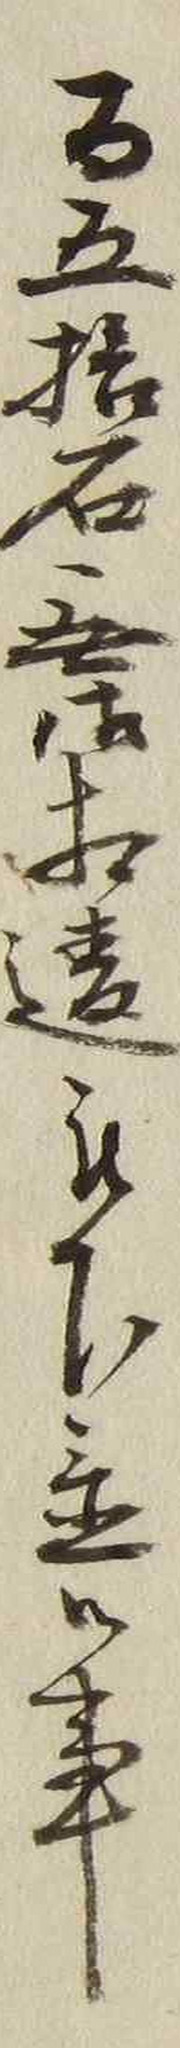百五拾石無御相違被下置候事
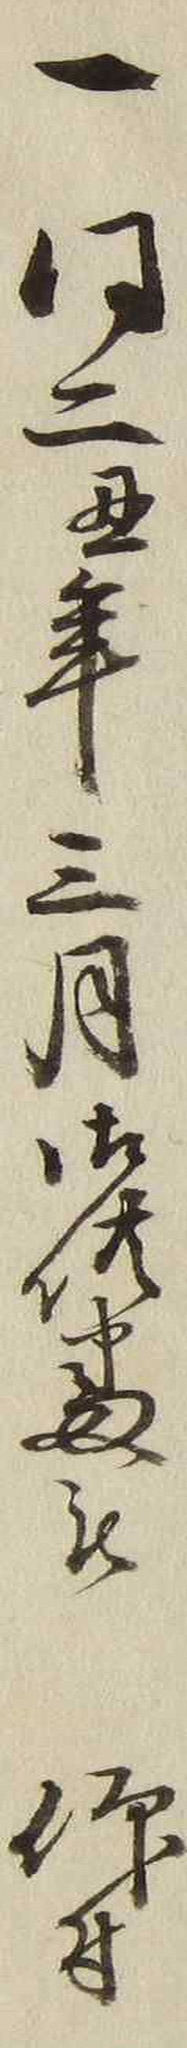一同二丑年三月御供番被仰付

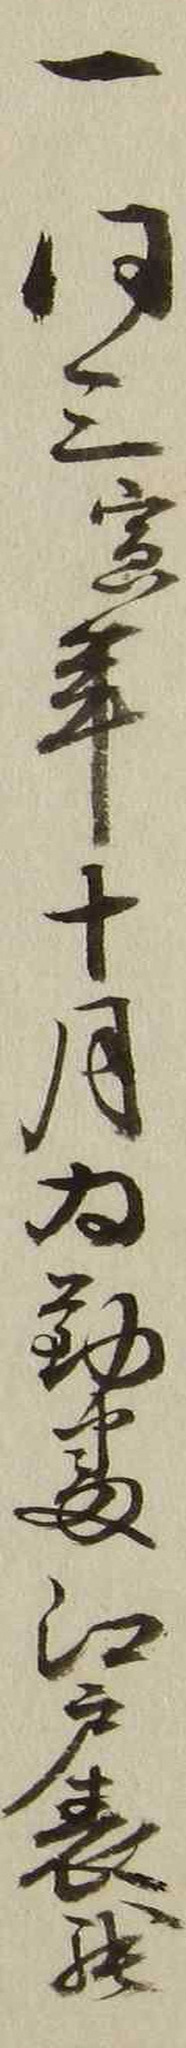一同三寅年十月為勤番江戸表へ罷
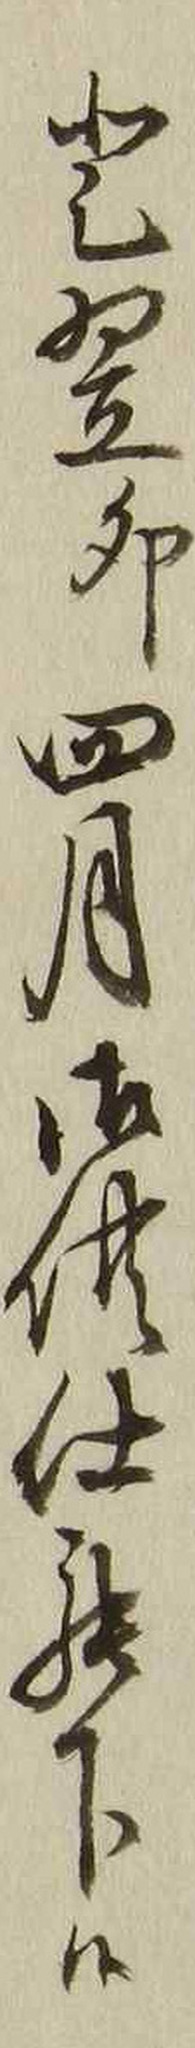登翌卯四月御供仕罷下候
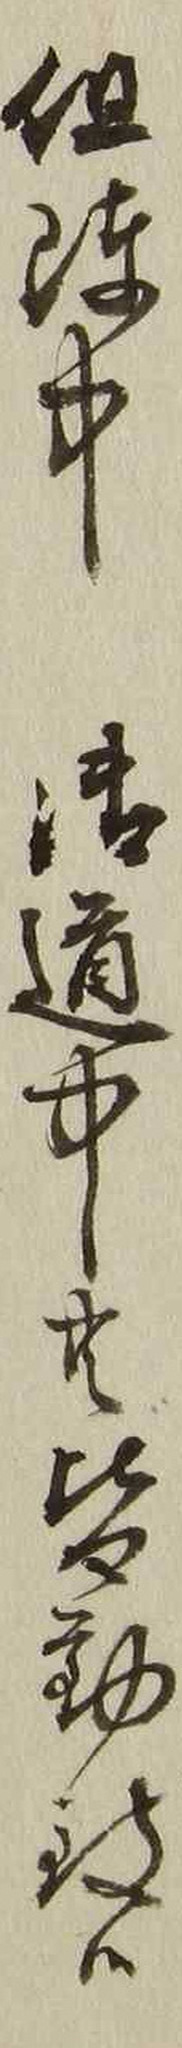但陣中御道中共皆勤致候
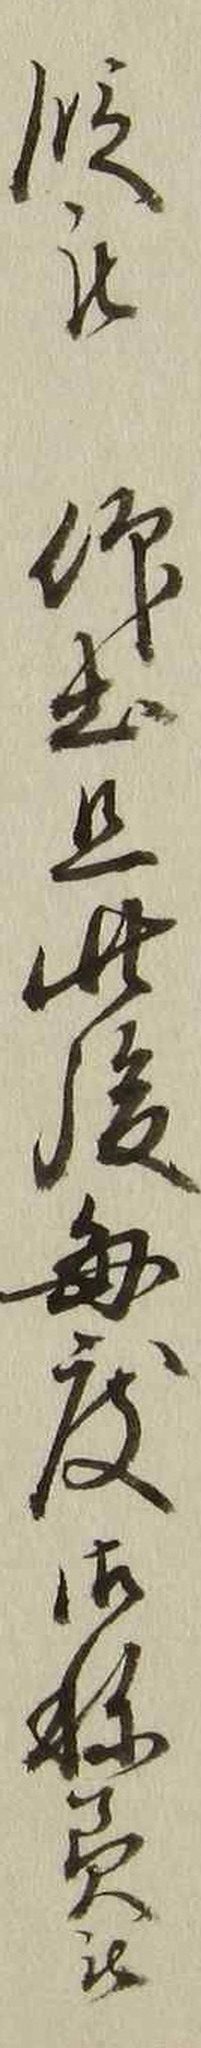段被仰出旦此後毎度御称美被
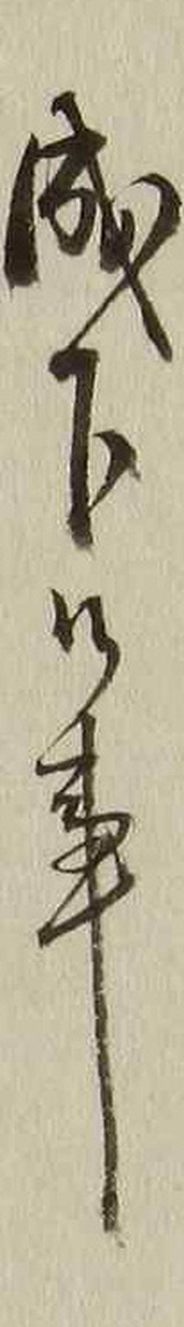成下候事
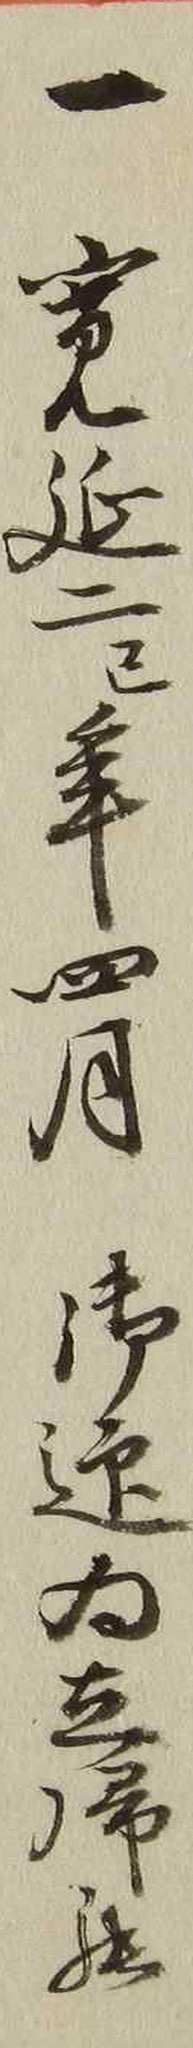一寛延二巳年四月御迎為立帰罷
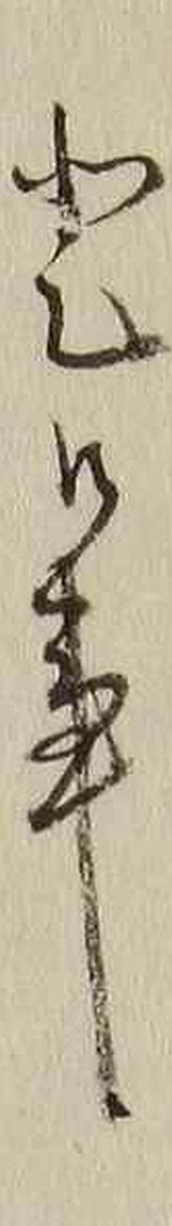登候事
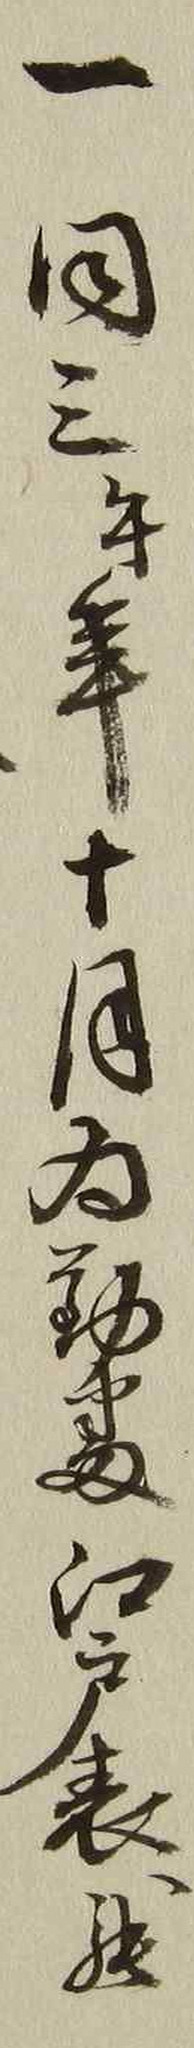一同三午年十月為勤番江戸表へ罷
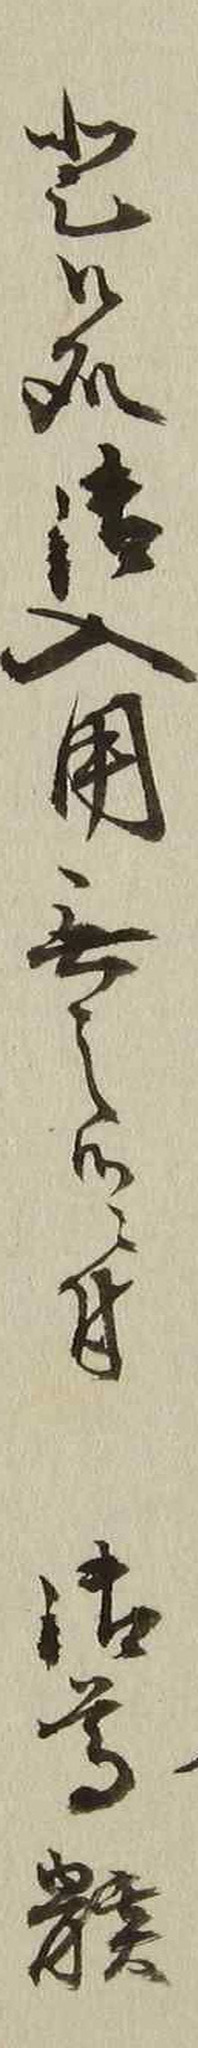登候処御入用無之候ニ付御尊骸
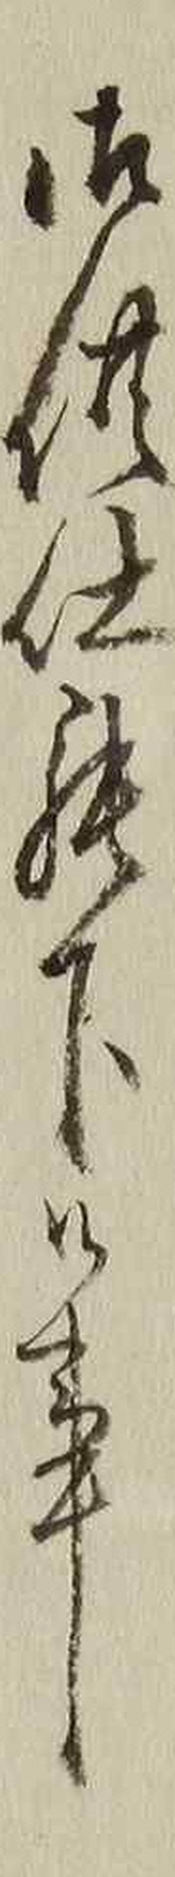御供仕罷下候事
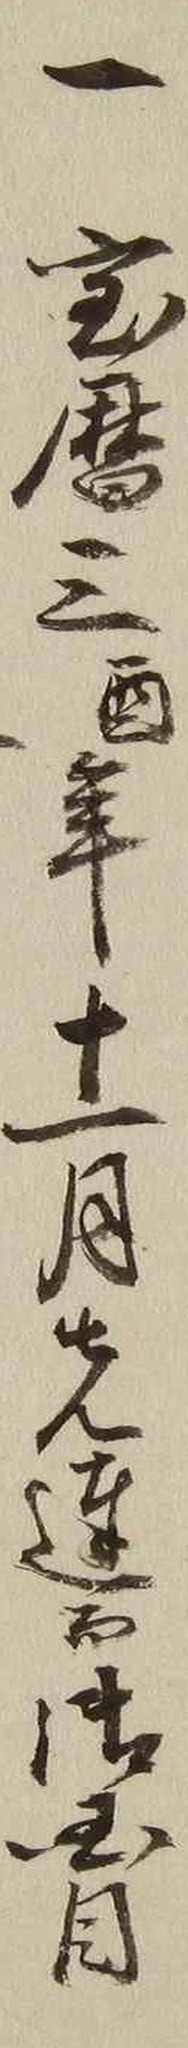一宝暦三酉年十一月先達而御国目
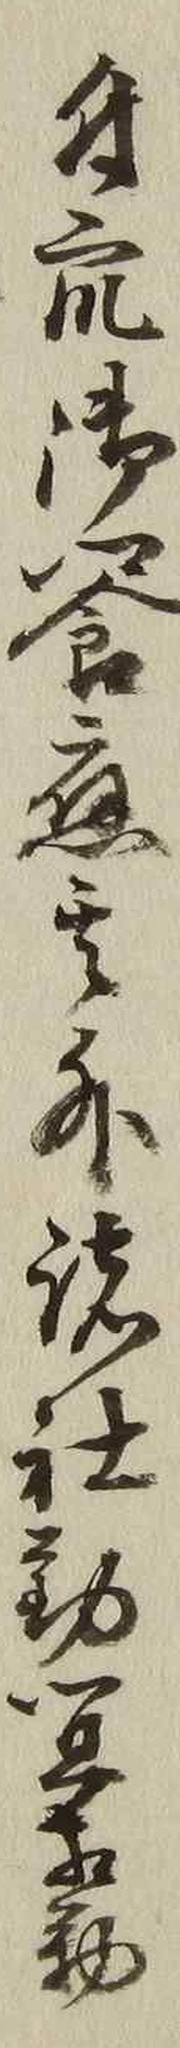付衆御饗応其外諸社勤宜相勤
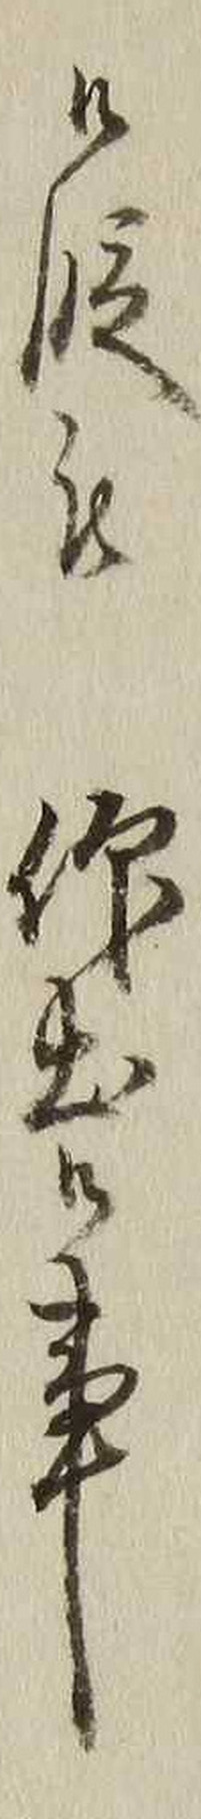候段被仰出候事
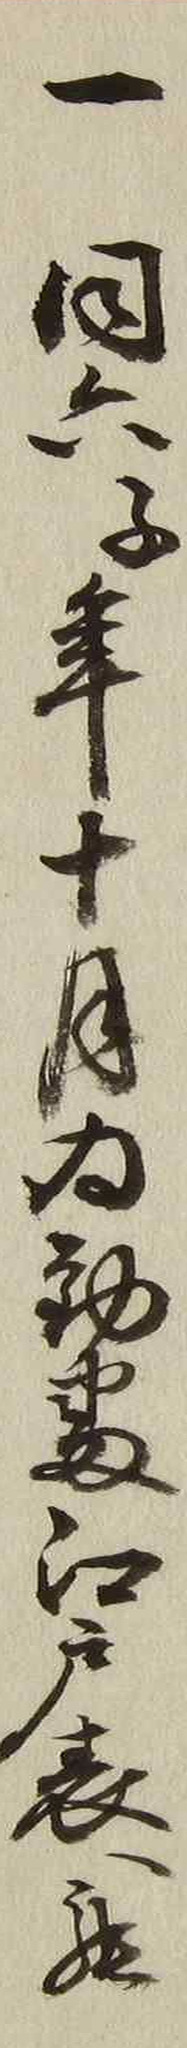一同六子年十月為勤番江戸表へ罷
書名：諸士系譜　巻之23　い之部23
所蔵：会津若松市立会津図書館
